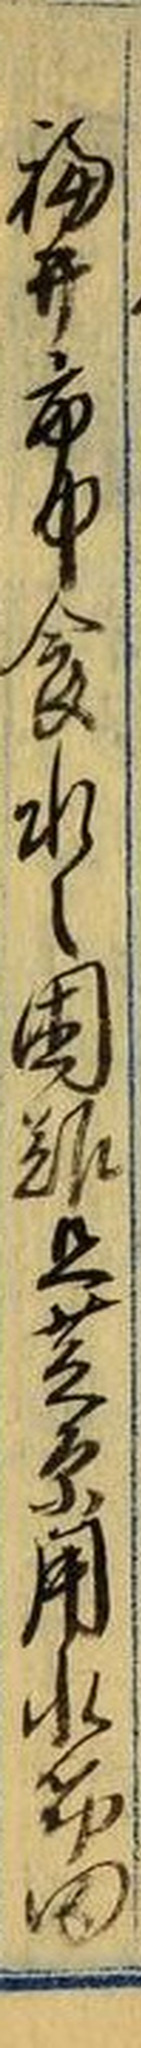福井市中食水之困難且芝原用水筋田
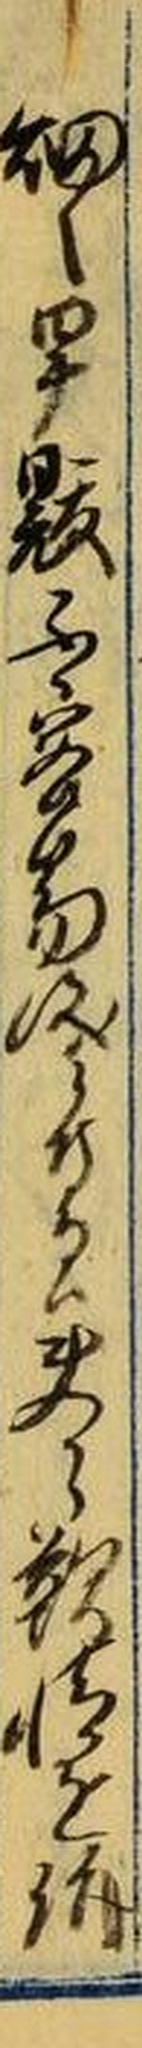畑之旱魃不容易儀に付而は夫々歎情を訴
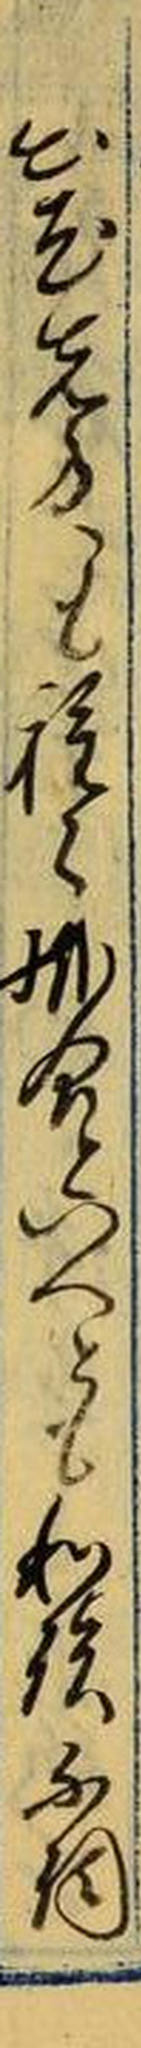出尤先方へも種々掛合といへとも和談不調
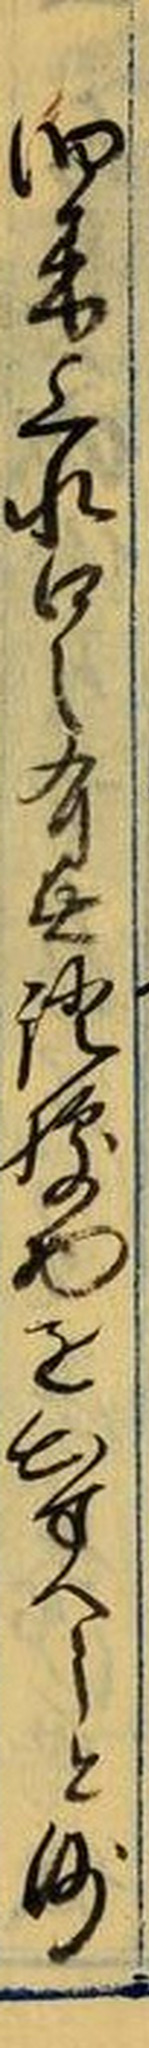旧来上水口之有無証拠物を出すべしと沙
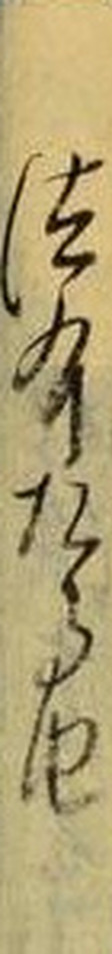汰有たる由
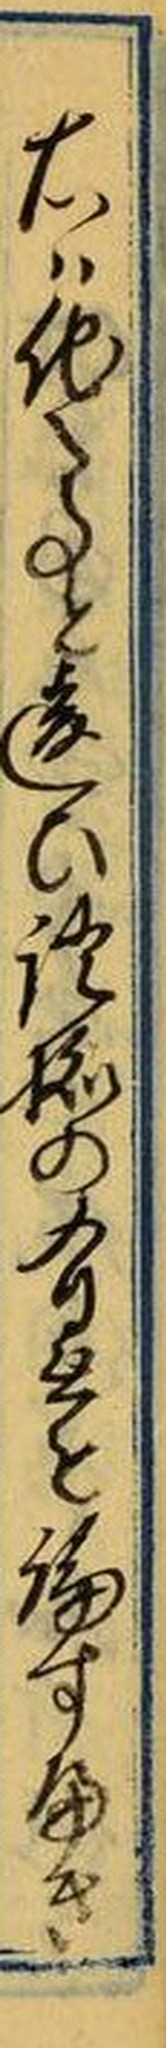右は他之事と違ひ証拠の有無を論すへき
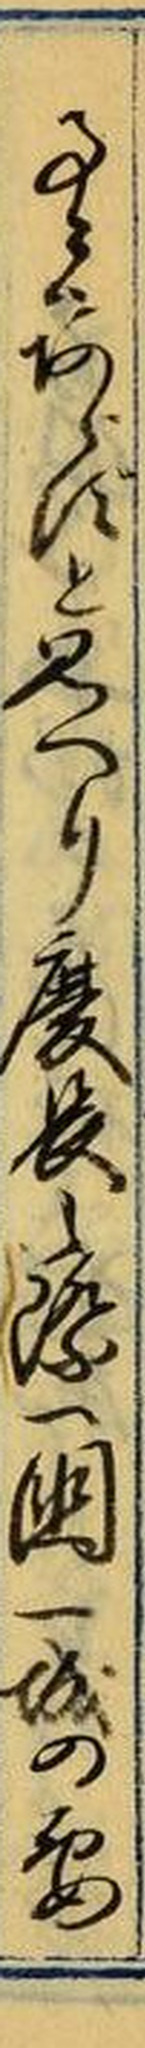事にはあらずと思へり慶長之際一国一城の要
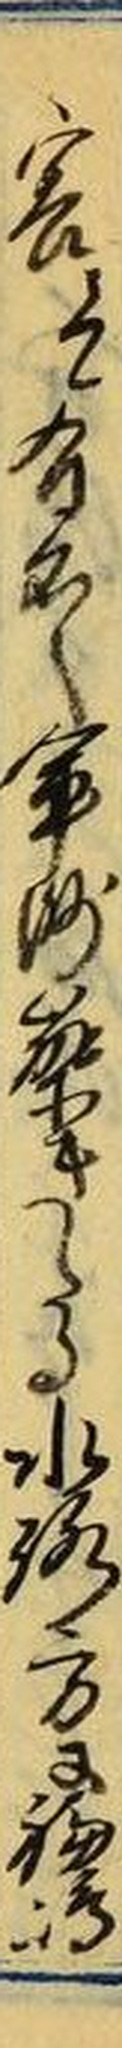害にて有名之軍師築きたる水路方に福嶋
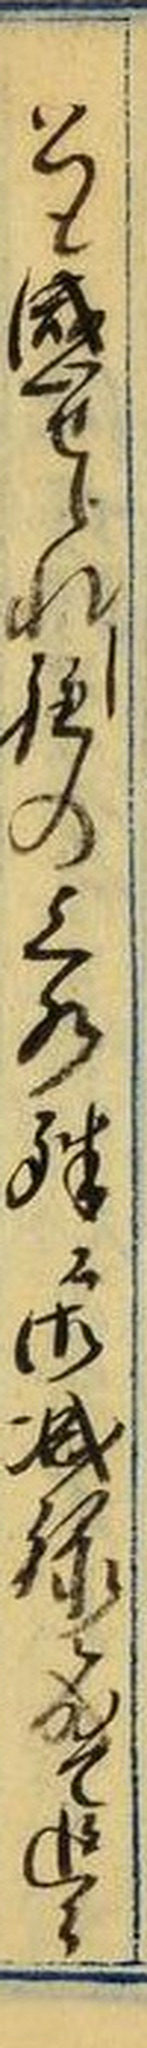公も感せられし程の上水殊に御減禄に成て追々
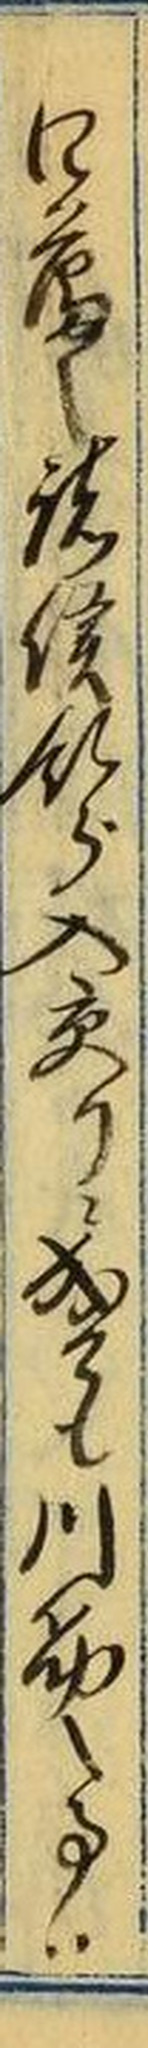同藩之諸侯領分入交りに成ても川筋之事は
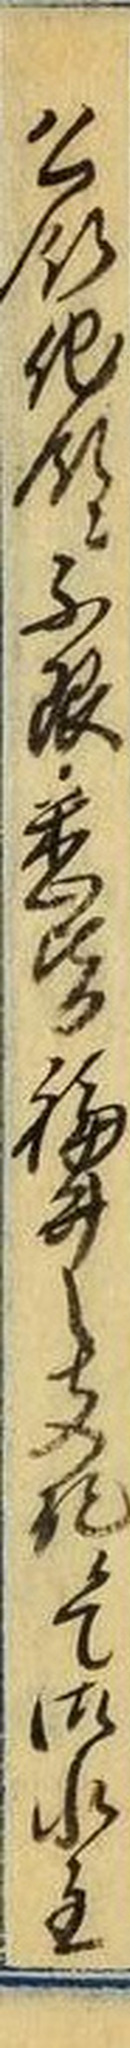公領他領に不限悉皆福井之支配にて御水主
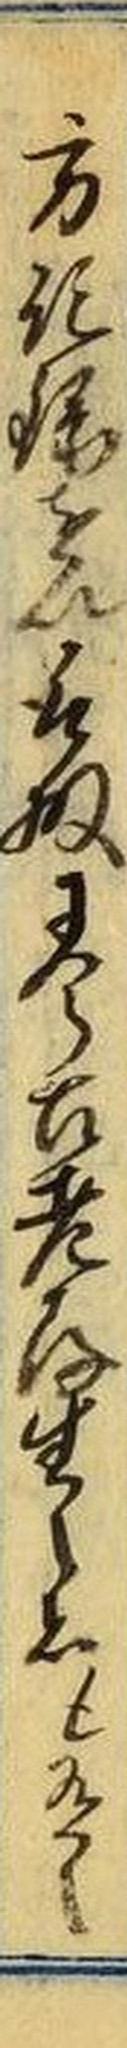方記録を以取扱于今古老存生之者も有之
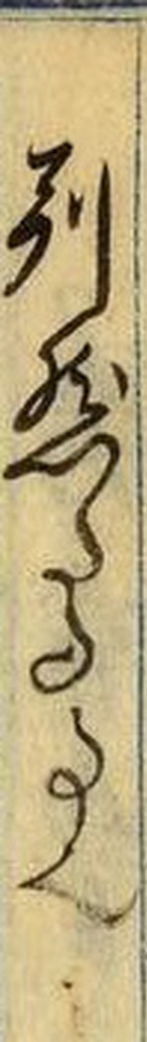判然たる事也
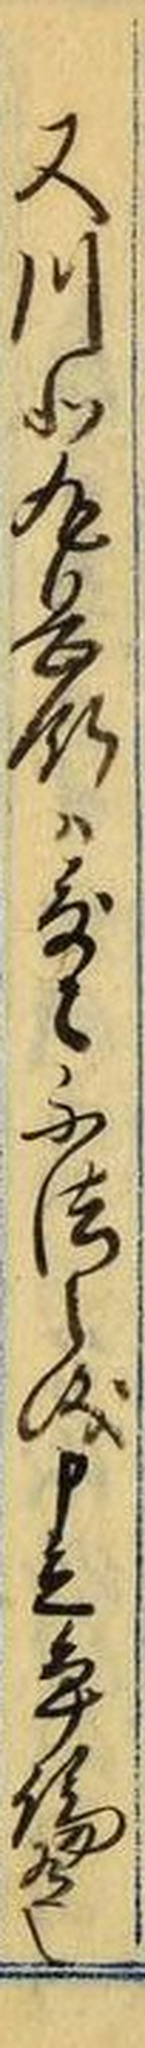又川北丸岡領は度々不法之儀申立争論有之
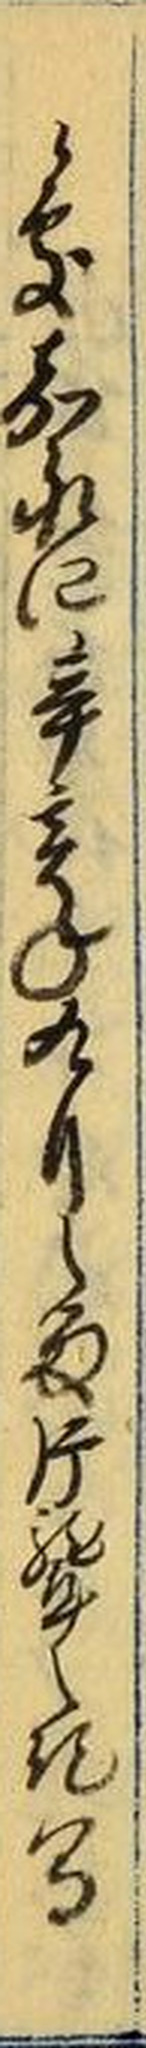候処嘉永四年辛亥年九月之両片聾之記写

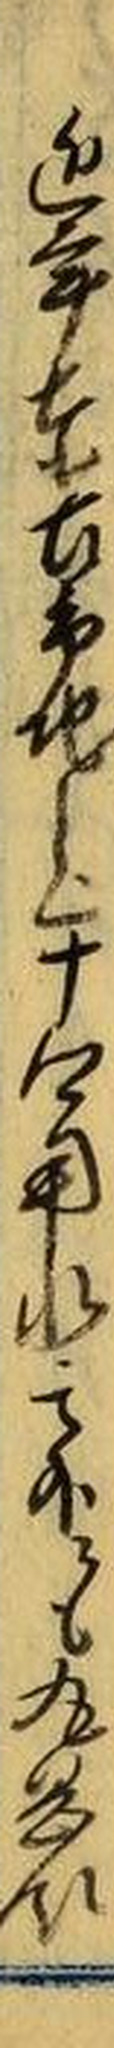近年東古市地上十郷用水其外にも丸岡領
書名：温古集 五巻
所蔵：福井県文書館 Fukui Prefectural Archives
